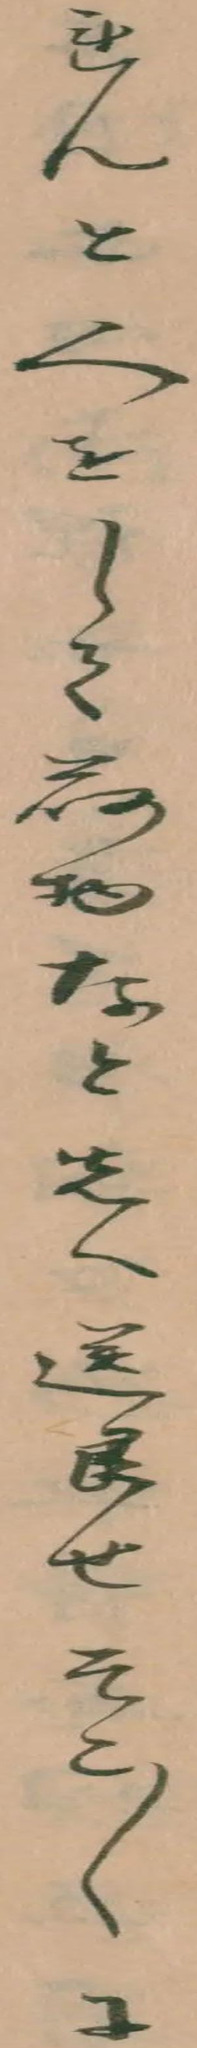れんと人をして荷物なと先へ送らせそこ〳〵に
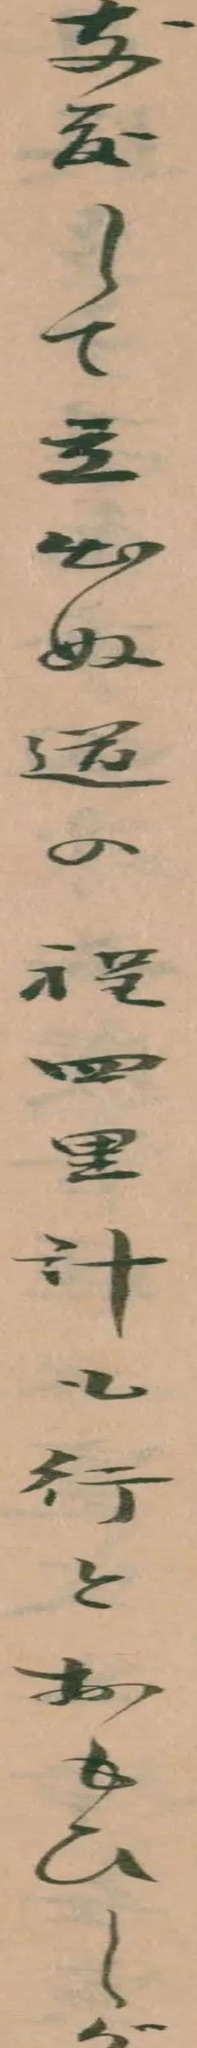仕度して立出ぬ道の程四里計も行とおもひしが
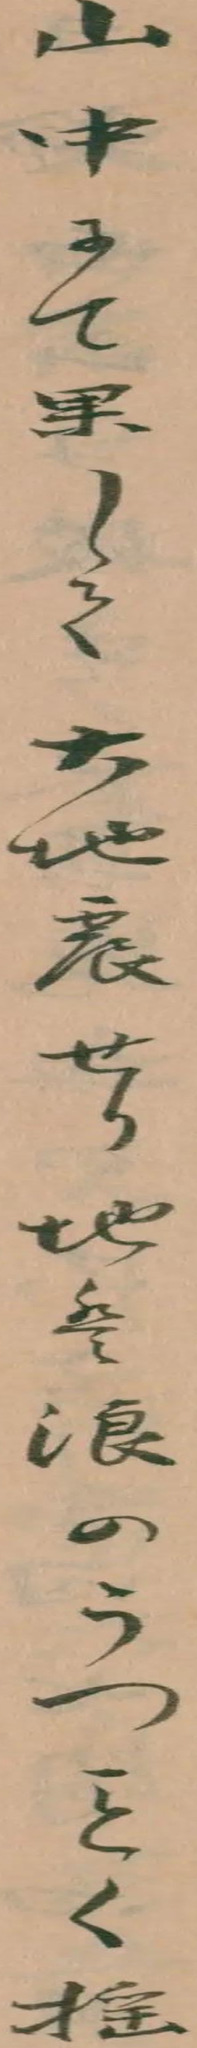山中にて果して大地震せり地は浪のうつことく揺
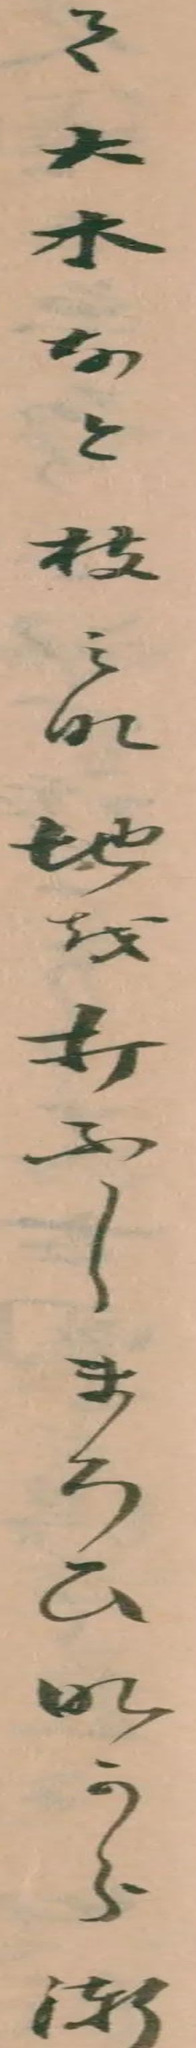て大木なと枝みな地を打ふしまろひなから漸
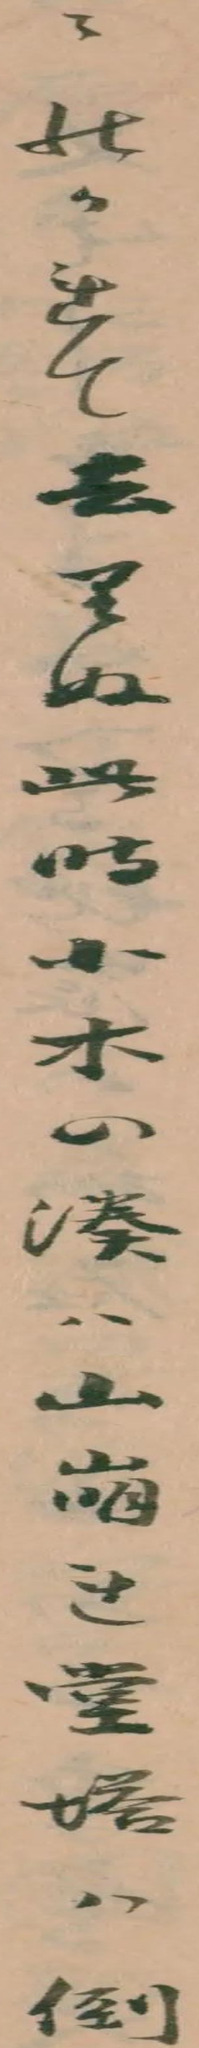々のかれて去りぬ此時小木の湊は山崩れ堂塔は倒
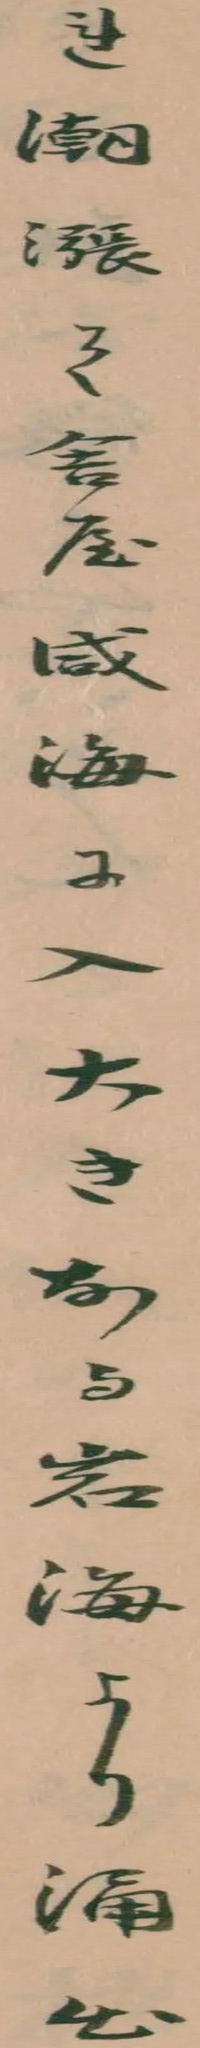れ潮漲て舎屋咸海に入大きなる岩海より涌出
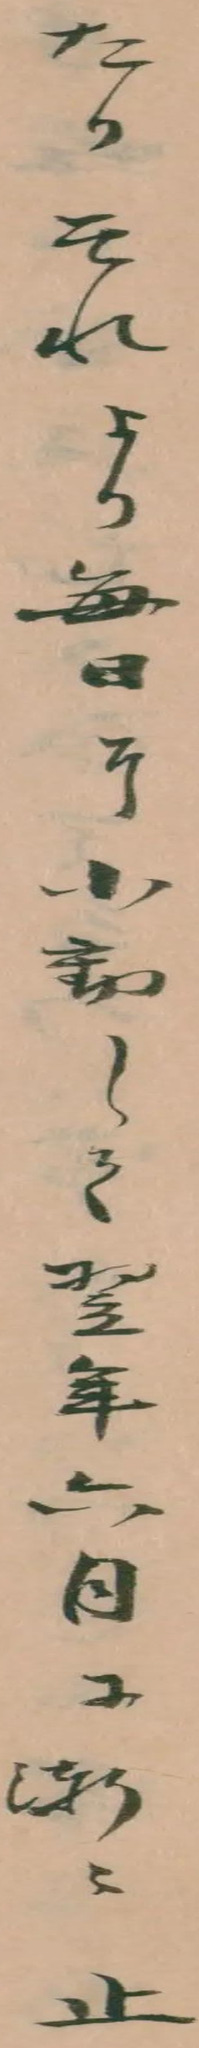たりそれより毎日に小動して翌年六月に漸々止
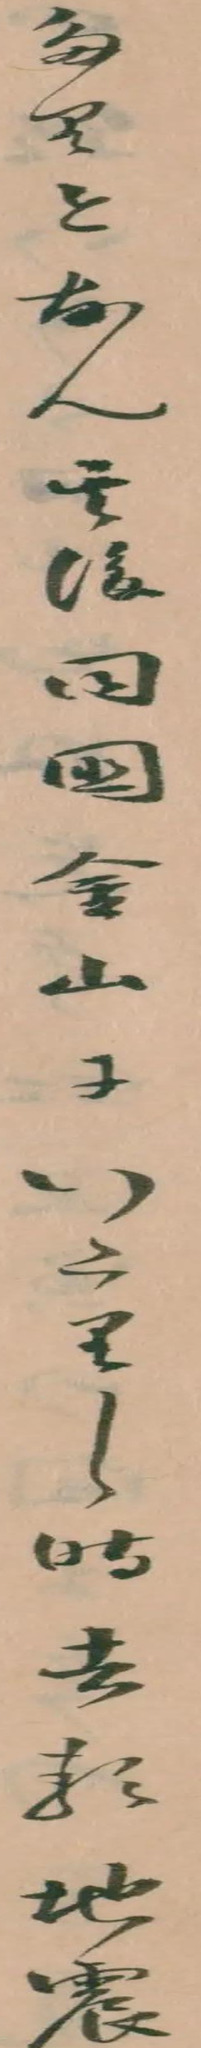たりとなん其後同国金山にいたりし時去る地震
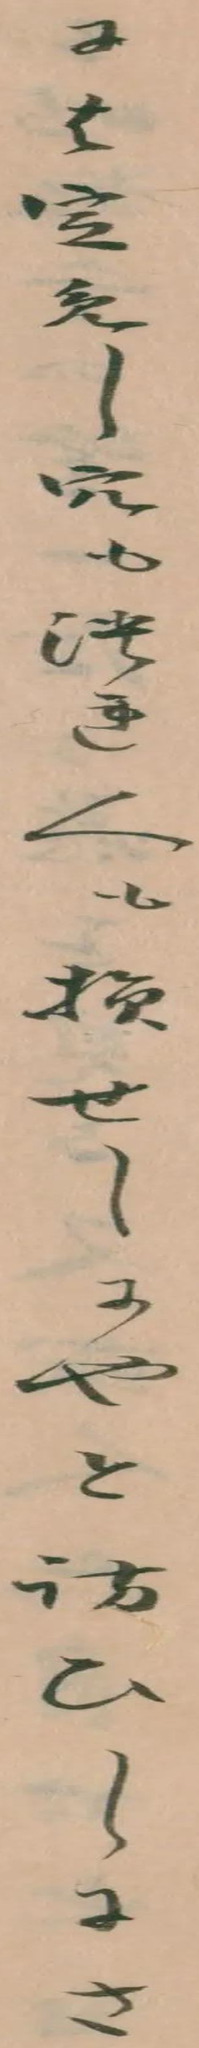には定めし穴も潰れ人も損せしにやと訪ひしにさ
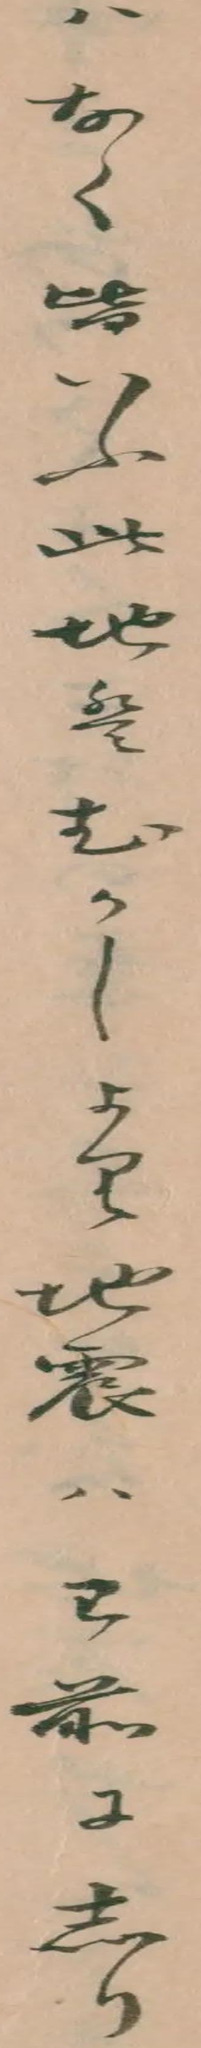はなく皆いふ此地はむかしより地震は已前にしり
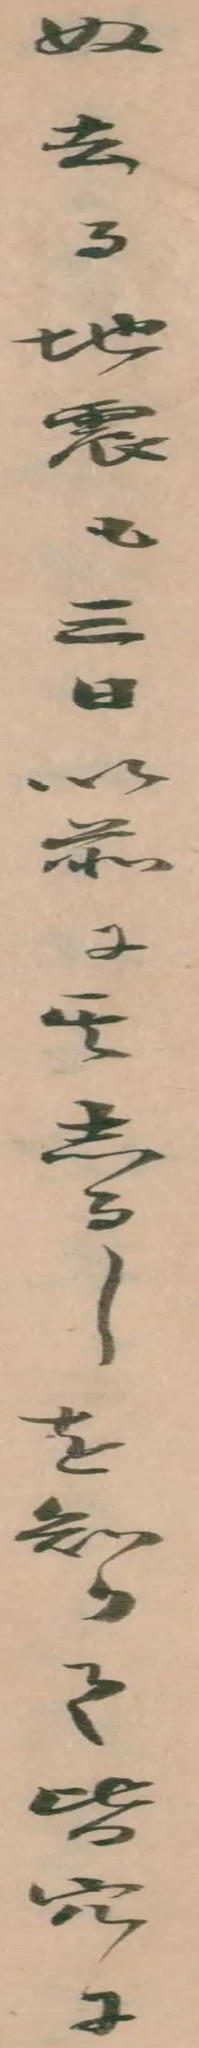ぬ去る地震も三日以前に其しるしを知りて皆穴に
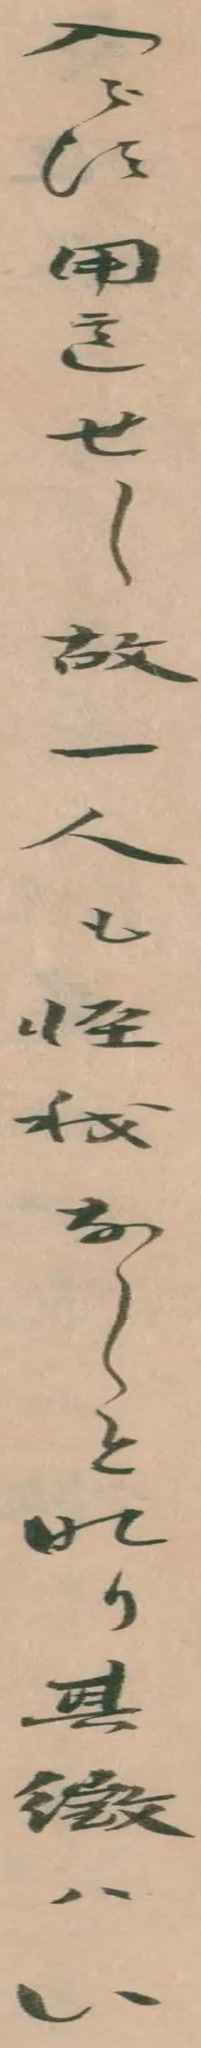入らす用意せし故一人も怪我なしとなり其徴はい
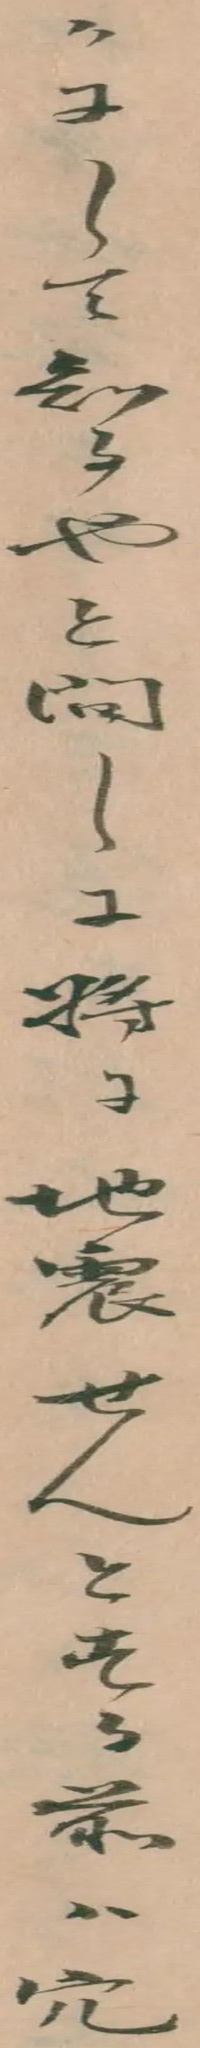かにして知るやと問しに将に地震せんとする前は穴

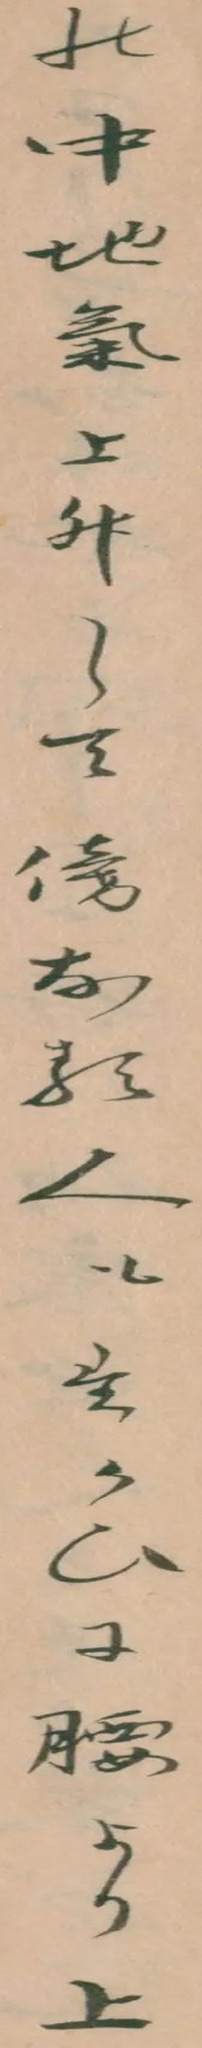の中地気上昇して傍なる人もたかひに腰より上
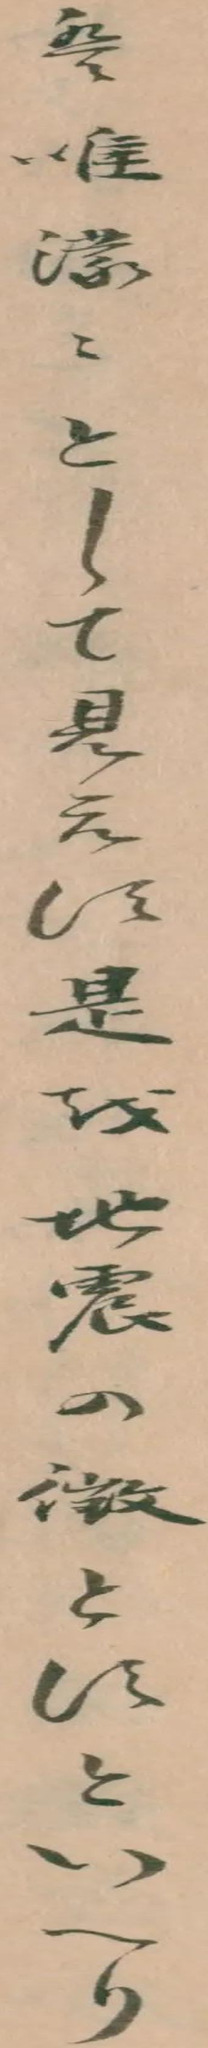は唯濛々として見えす是を地震の徴とすといへり
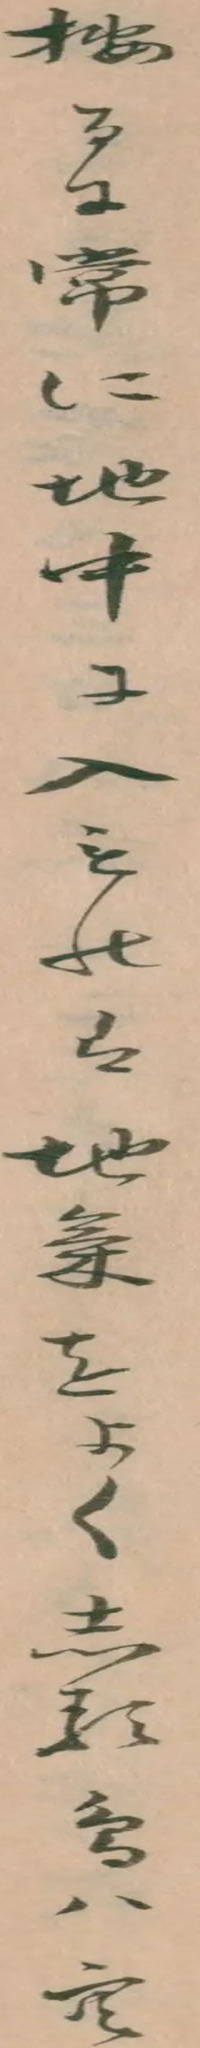按るに常に地中に入ものは地気をよくしる鳥は空
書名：地災撮要. 巻5-6(地震之部)
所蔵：国立国会図書館 National Diet Library, JAPAN
